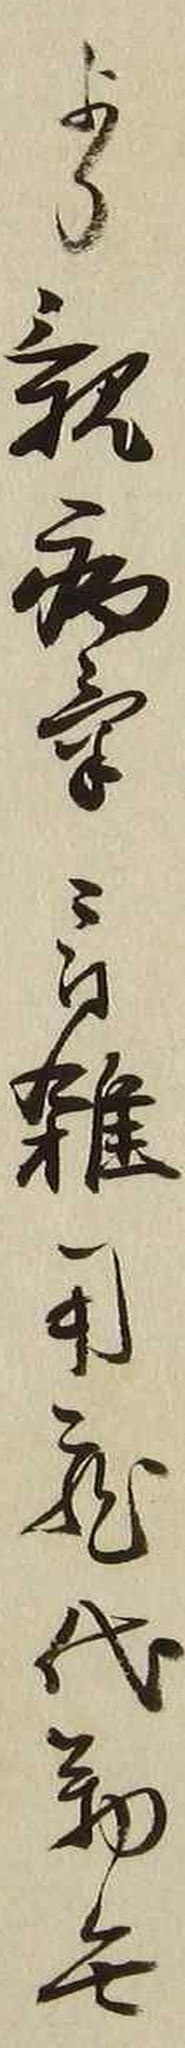より親病気ニ付雑用蔵代勤無
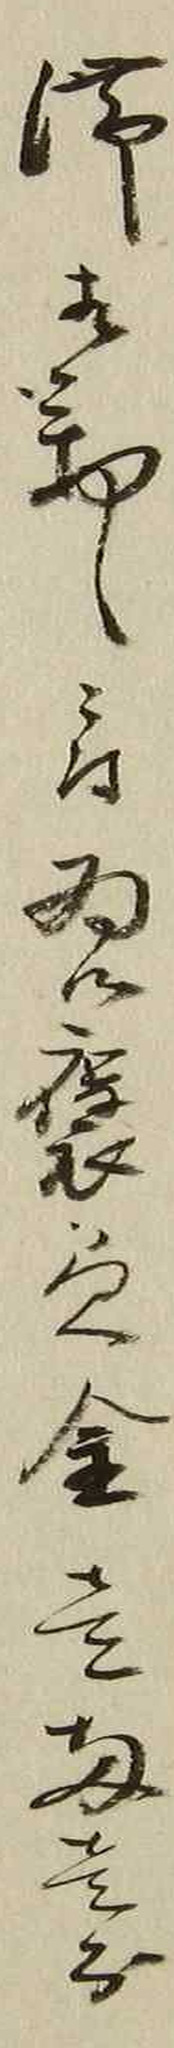滞相勤候ニ付為御褒美金壱両壱分
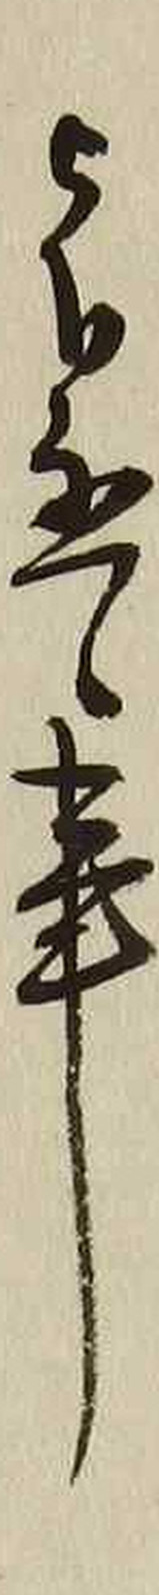被下置候事
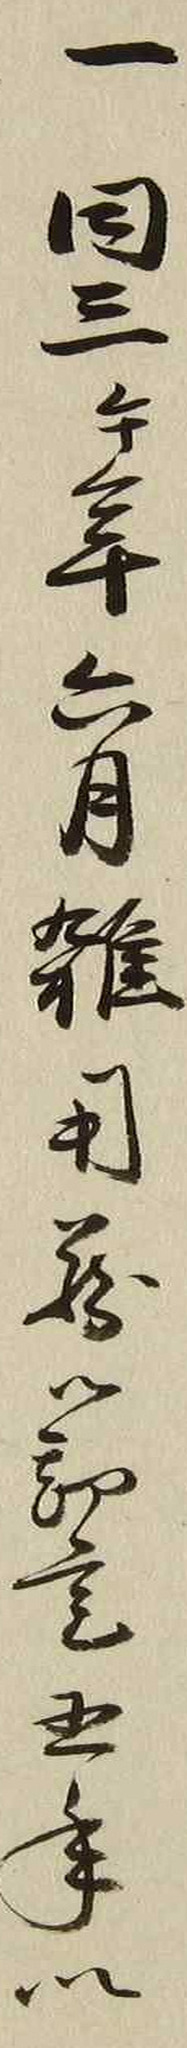一同三午年六月雑用蔵御勘定五年以
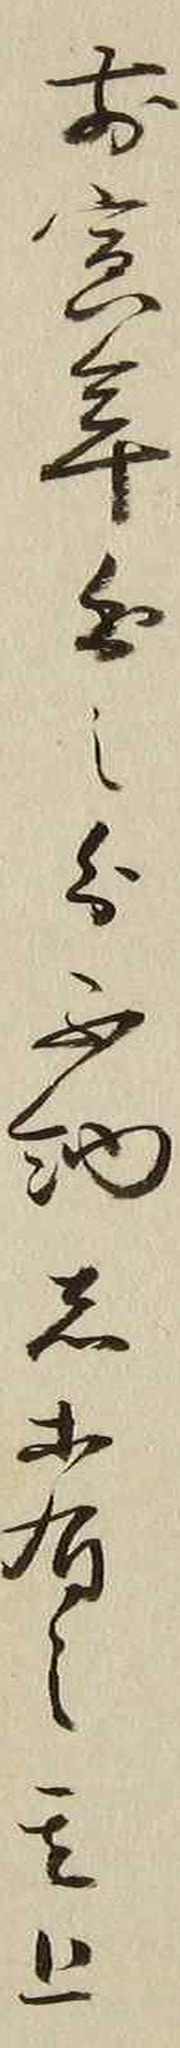前寅年分之分不納者等有之其上
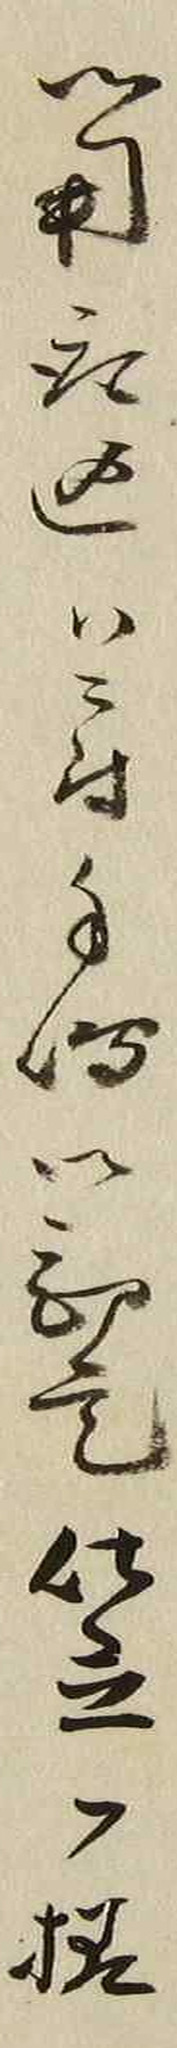御用取込候ニ付手伝御勘定仕立候様
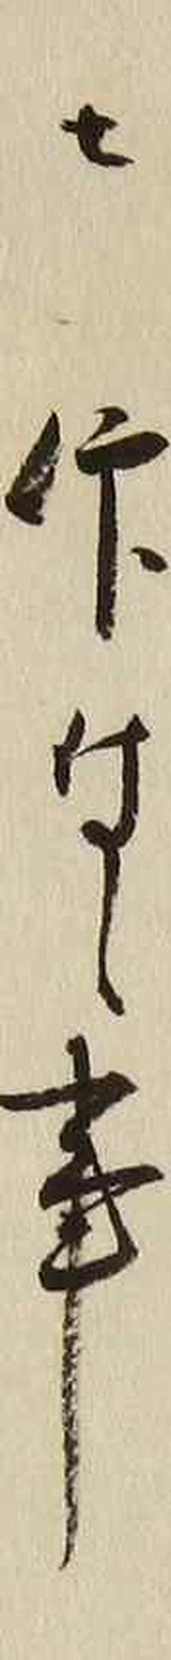被仰付候事
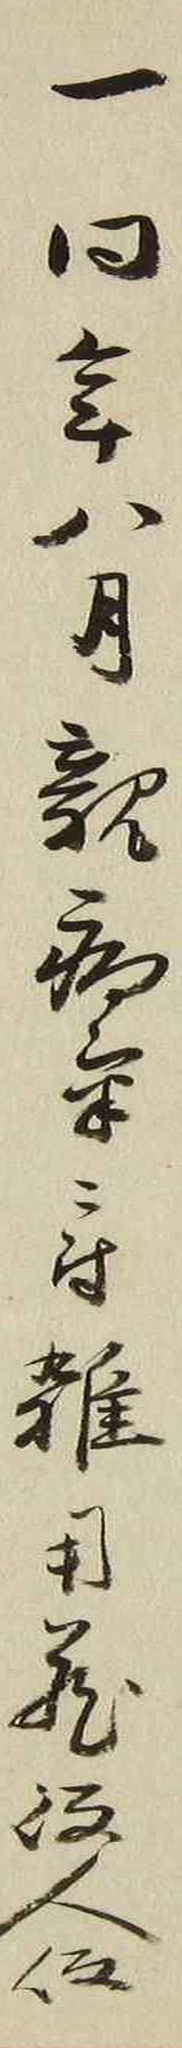一同年八月親病気ニ付雑用蔵役人仮
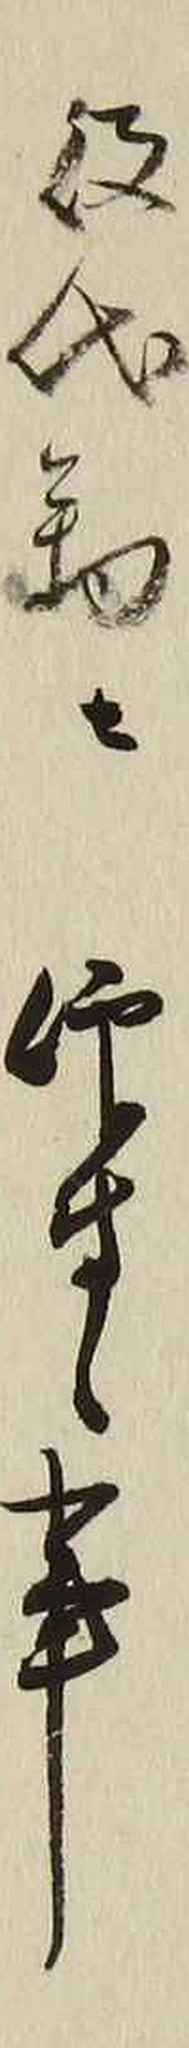役代勤被仰付候事
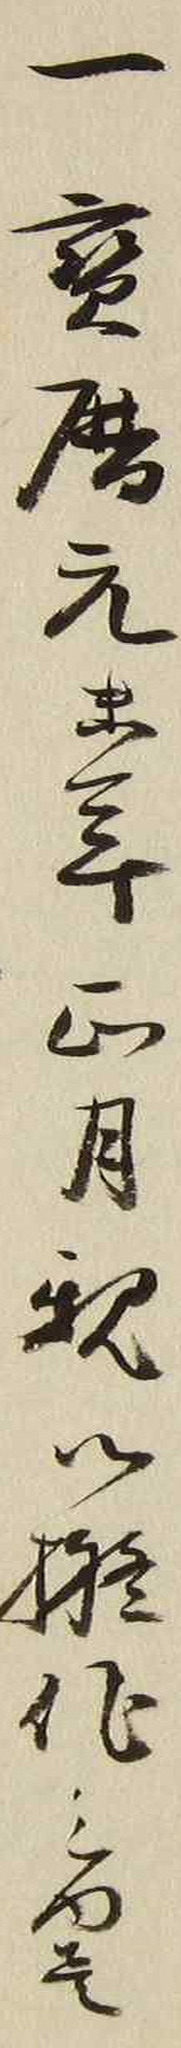一宝暦元未年正月親御擬作之内壱
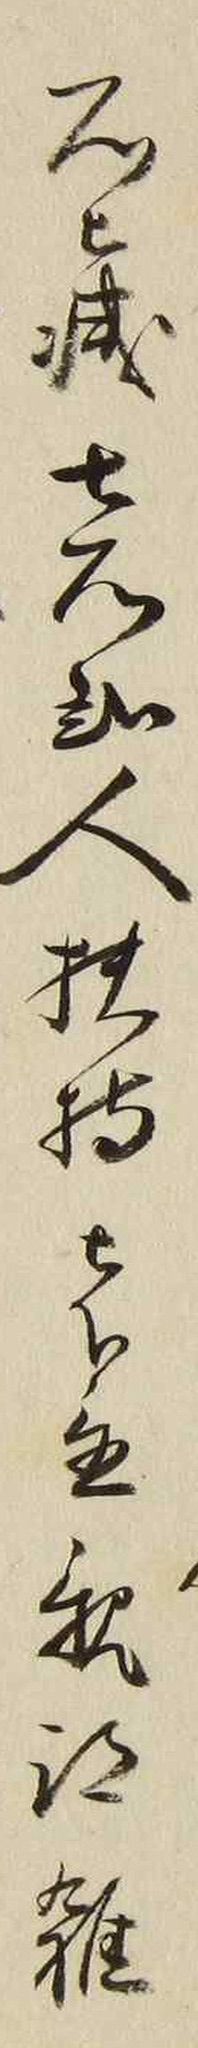石被減七石弐人扶持被下置親跡雑
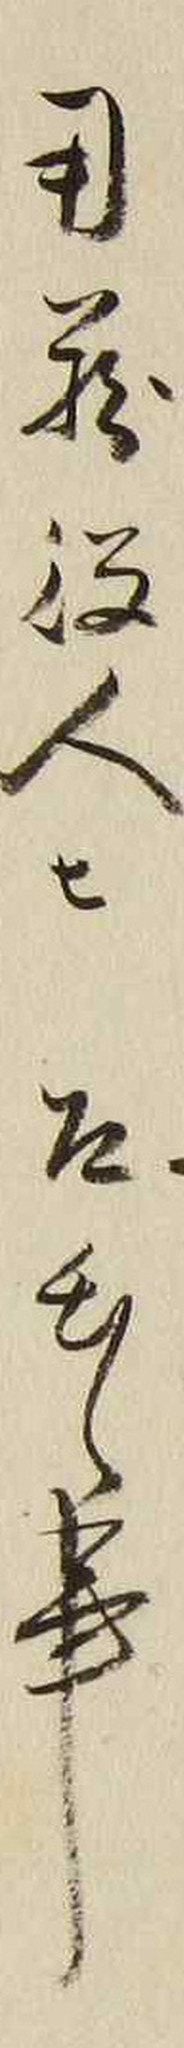用蔵役人被召出候事
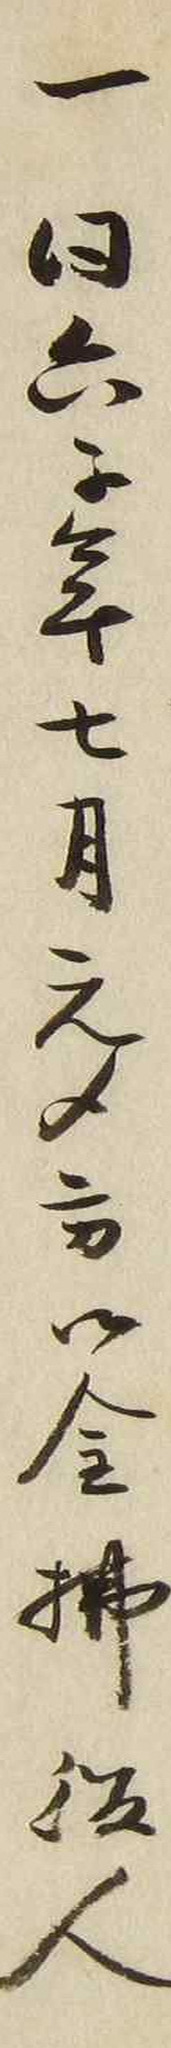一同六子年七月元〆方御金払役人

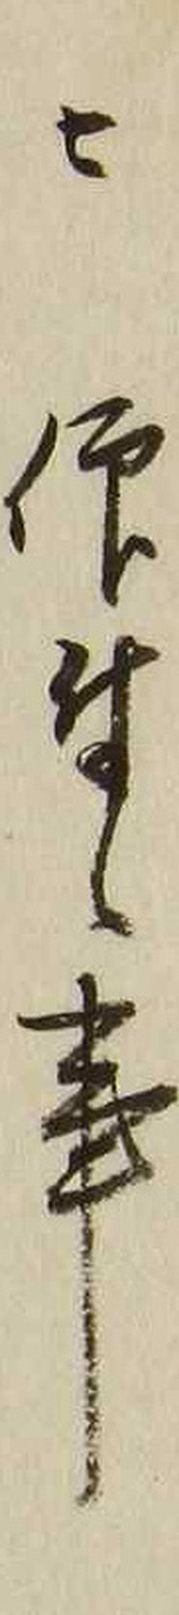被仰付候事
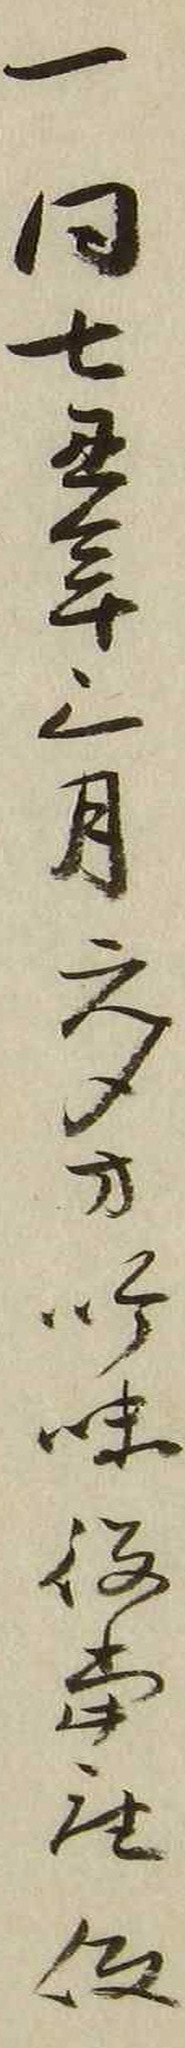一同七丑年三月元〆方吟味役当座仮
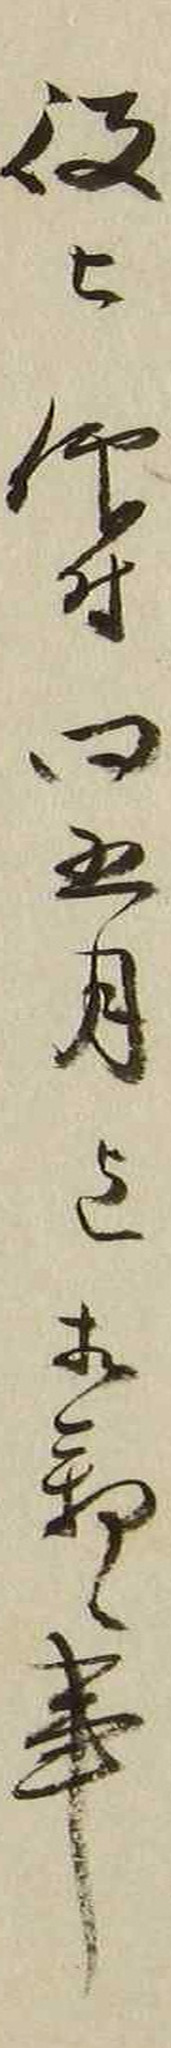役被仰付同五月迄相勤候事
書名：諸士系譜　巻之288　さ之部20
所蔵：会津若松市立会津図書館
